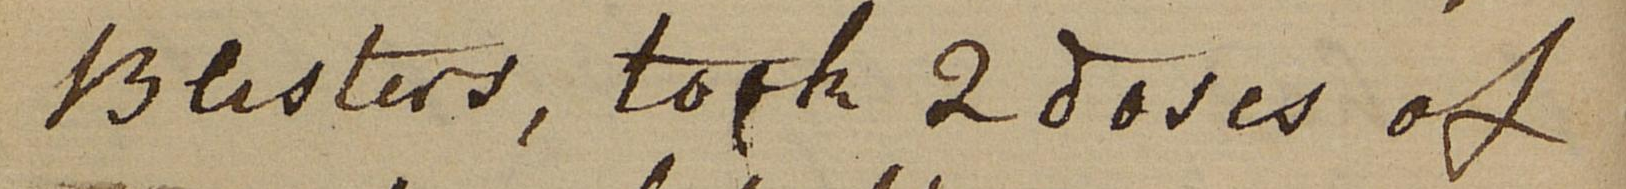Blisters, took 2 doses of
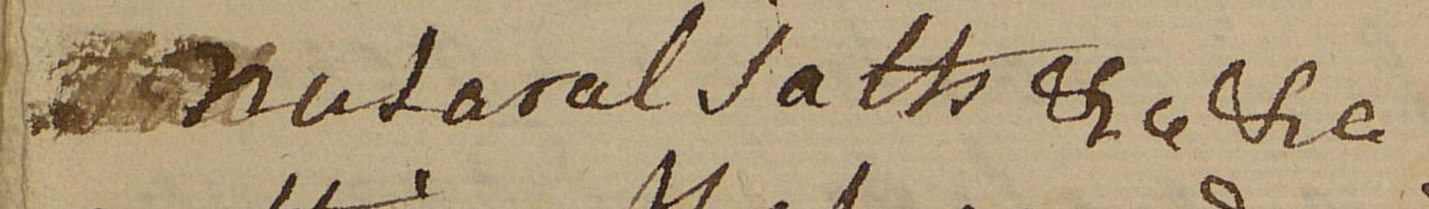Nutaral Satts &c &c
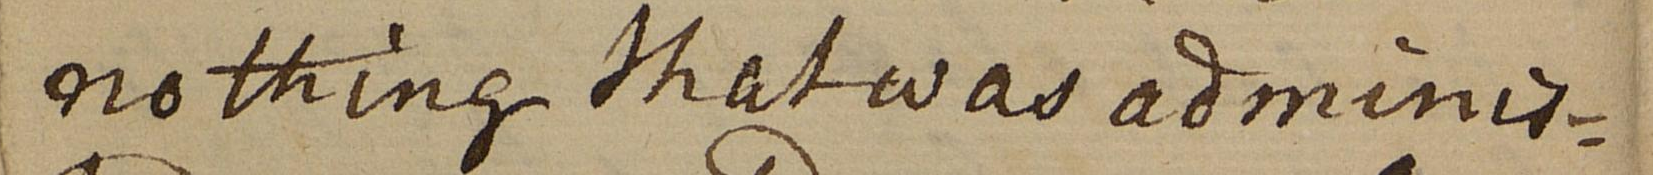nothing that was adminis-
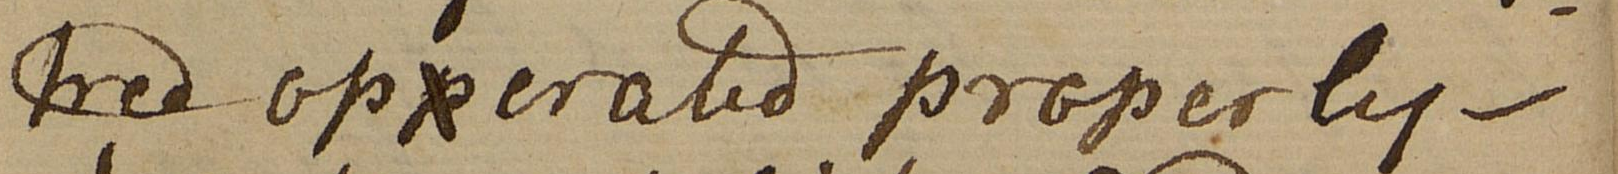tred opperated properly-
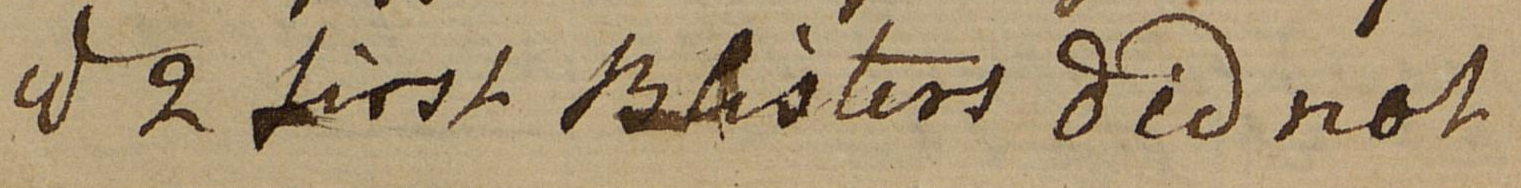y^e 2 first Blisters did not
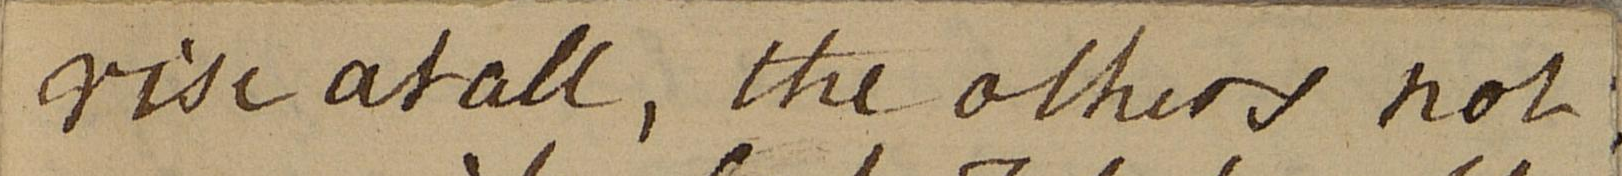rise at all, the others not
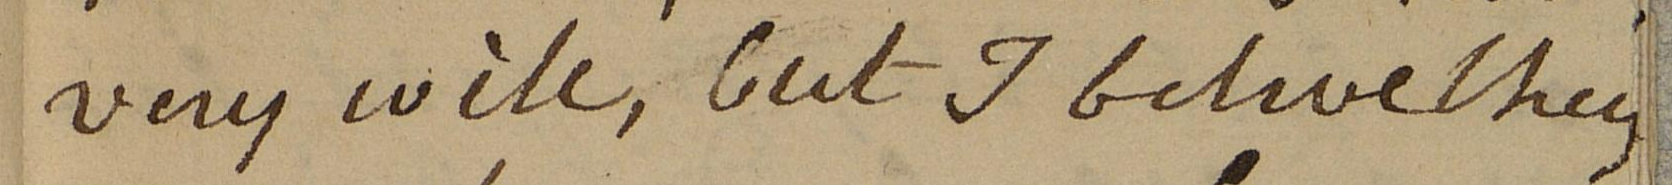very will, but I belive they
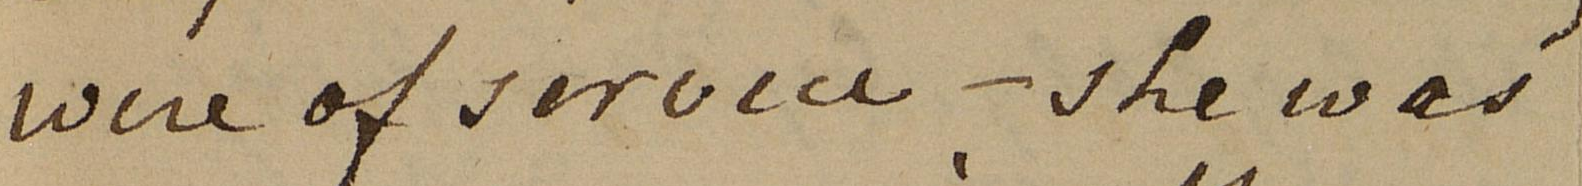were of service-, she was
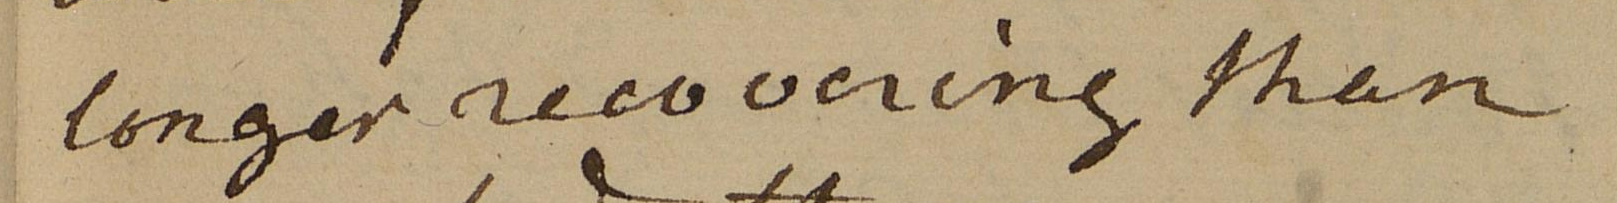longer recovering than
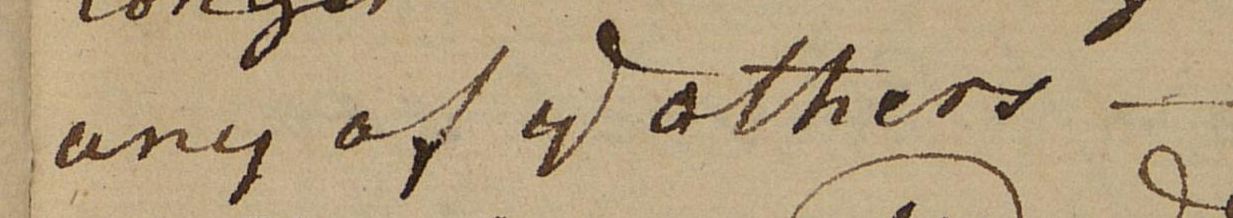any of y^e others-
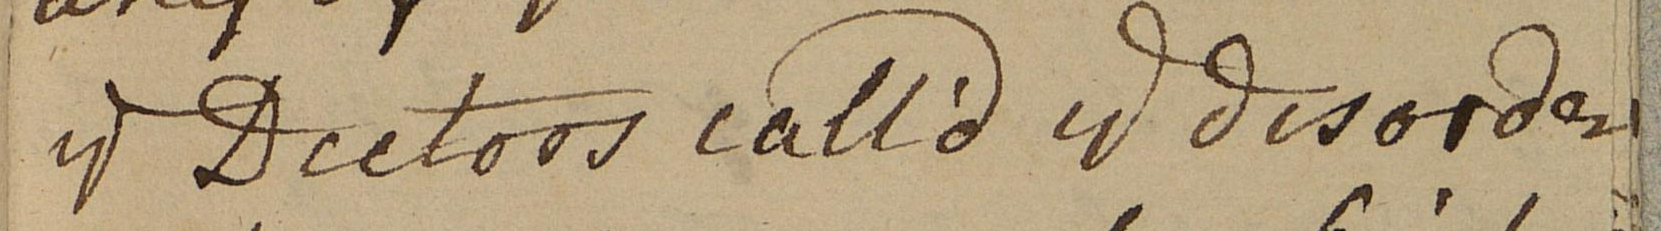y^e Dectors call'd y^e disorder
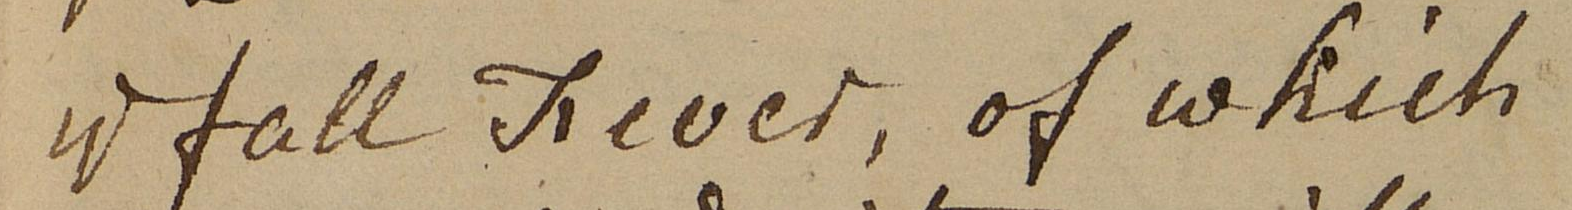y^e fall Fever, of which
